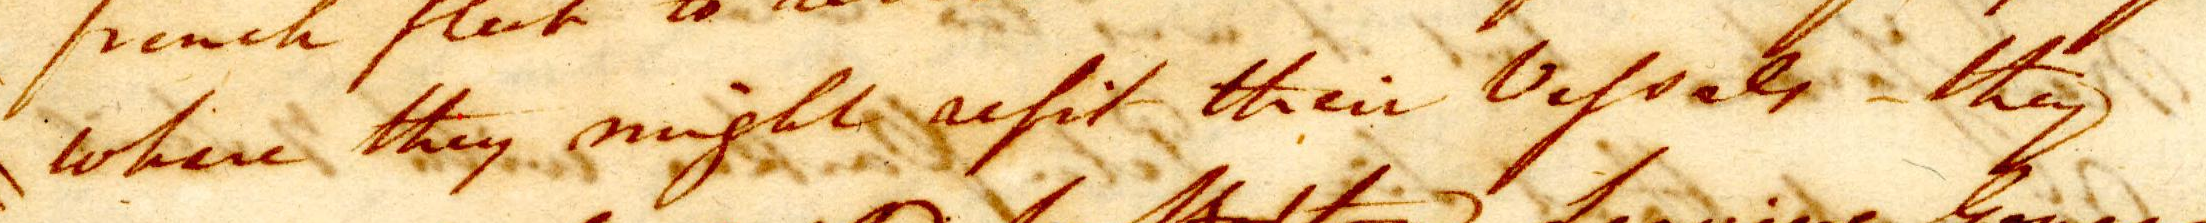where they might refit their Vessels. they
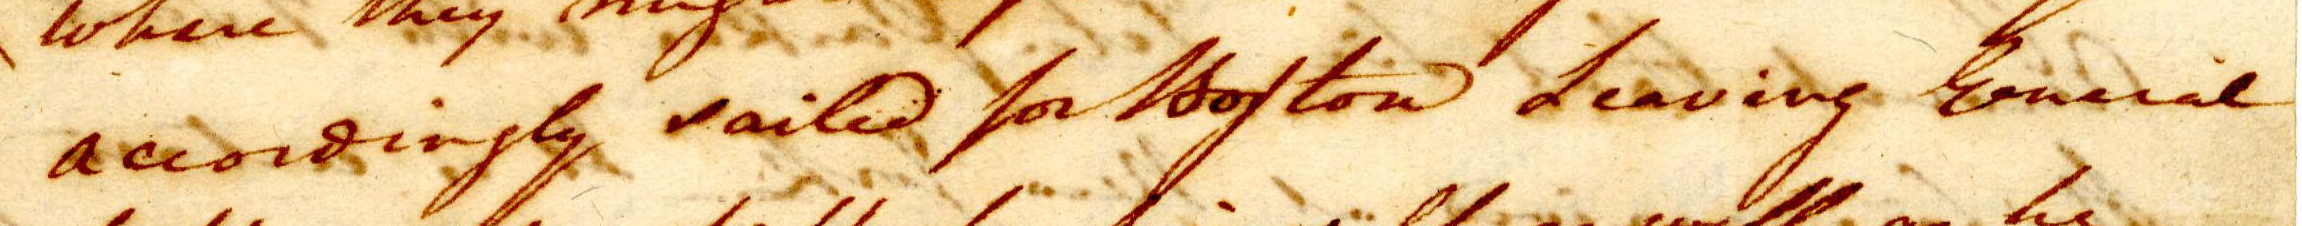accordingly sailed for Boston Leaving General
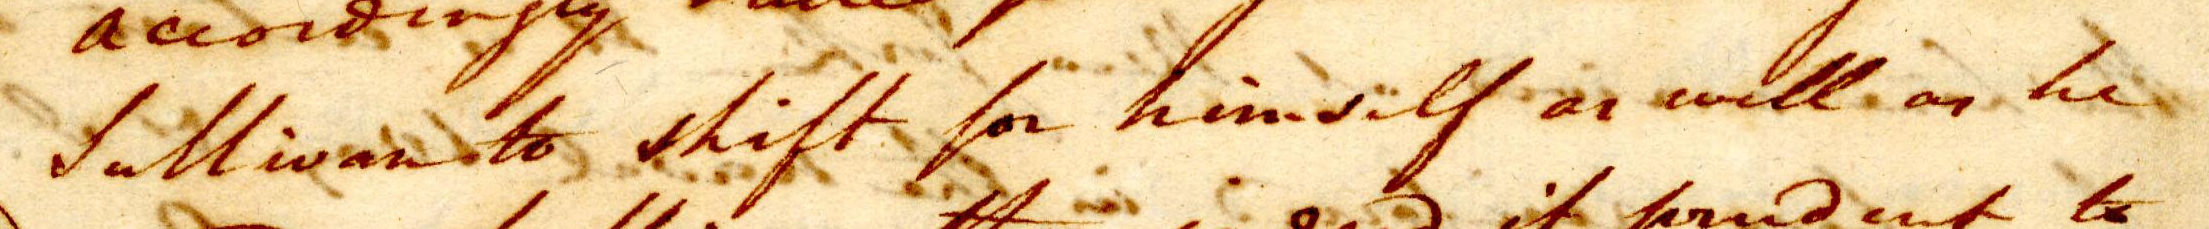Sullivan to shift for himself as well as he
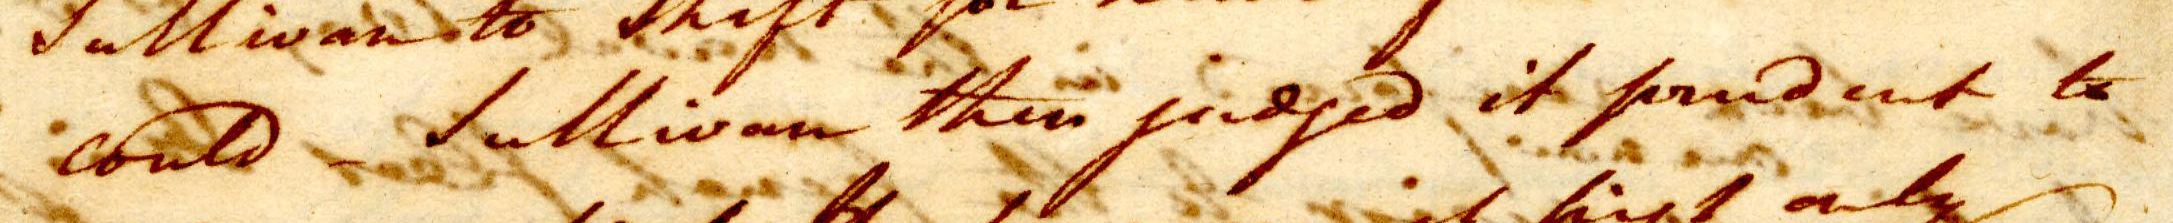could. Sullivan then judged it prudent to
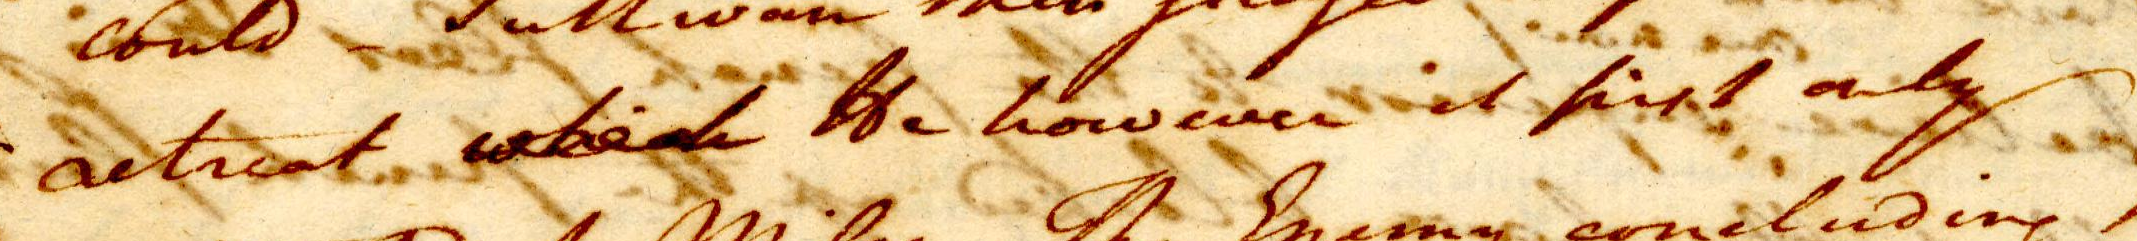retreat which He however it fist only
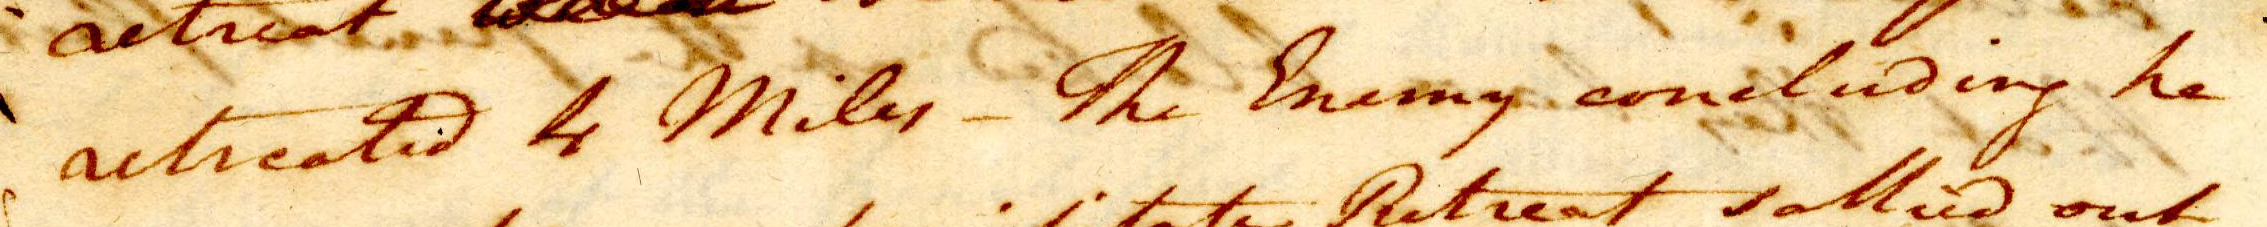retreated 4 Miles. The Enemy concluding he
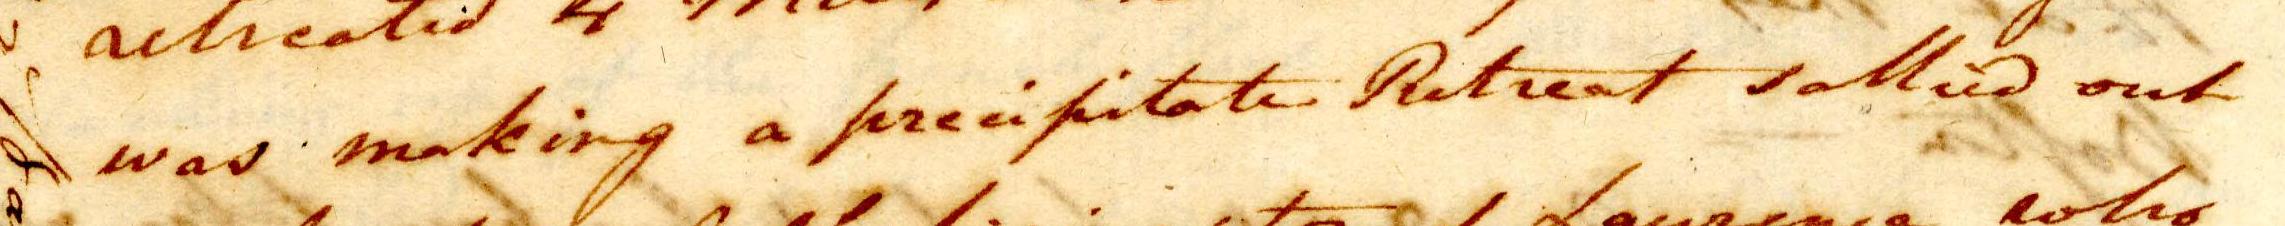was making a precipitate Retreat sallied out
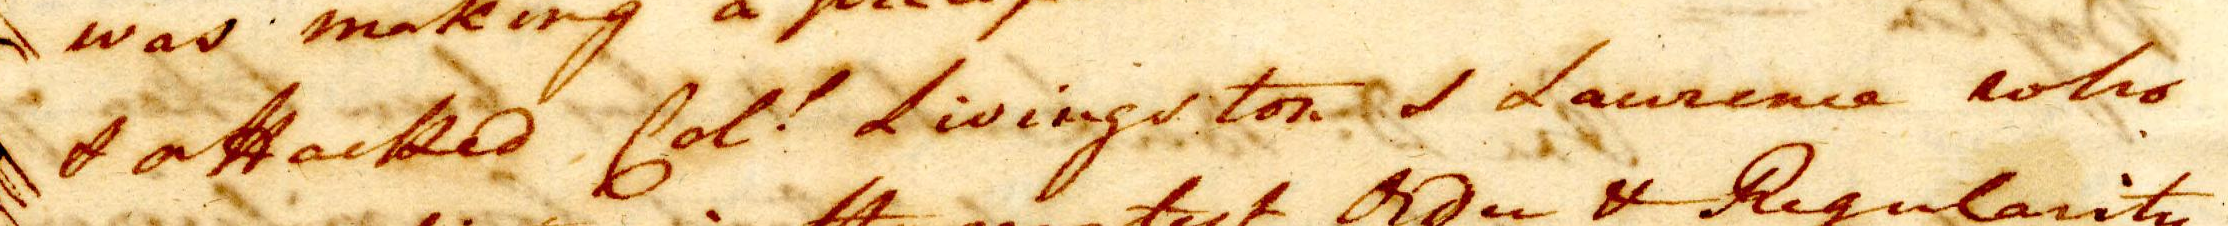& attacked Col^o. Livingston & Laurence who
